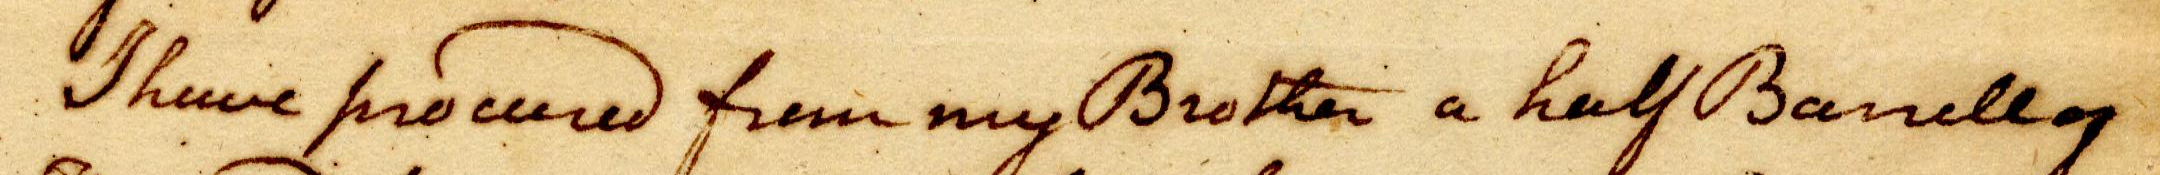I have procured from my Brother a half Barrell of
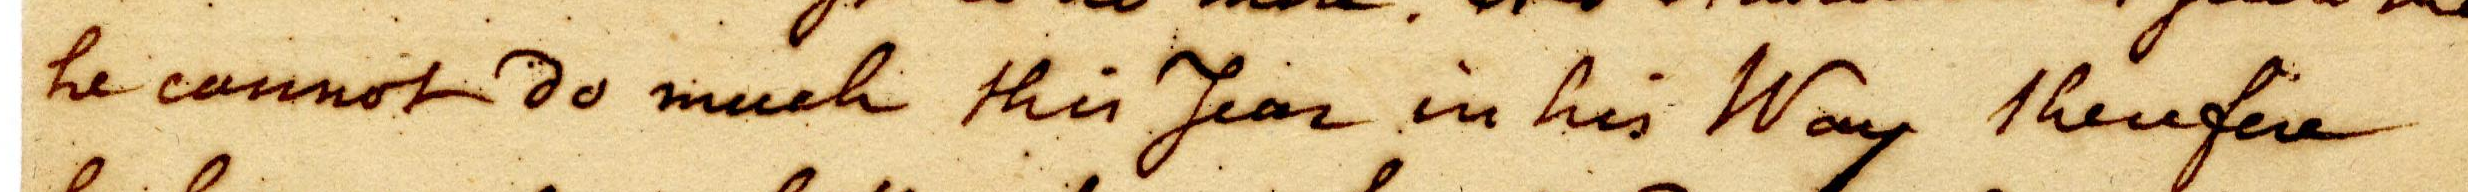he cannot do much this Year in his Way therefore
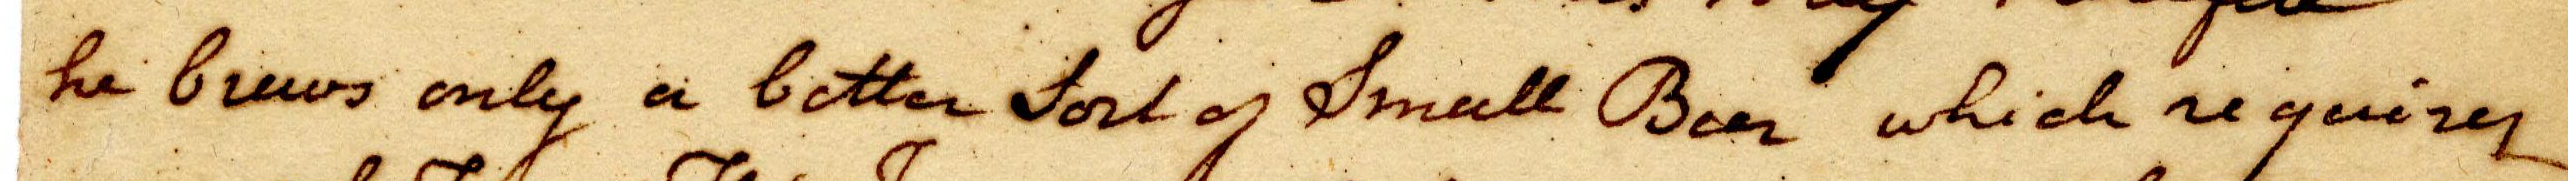he brews only a better Sort of Small Beer which requires
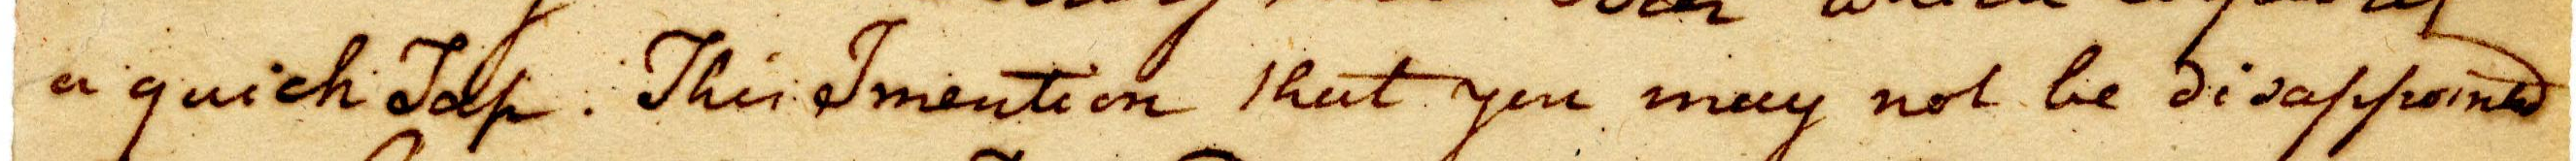a quick Tap. This Imention that you may not be do disappointed
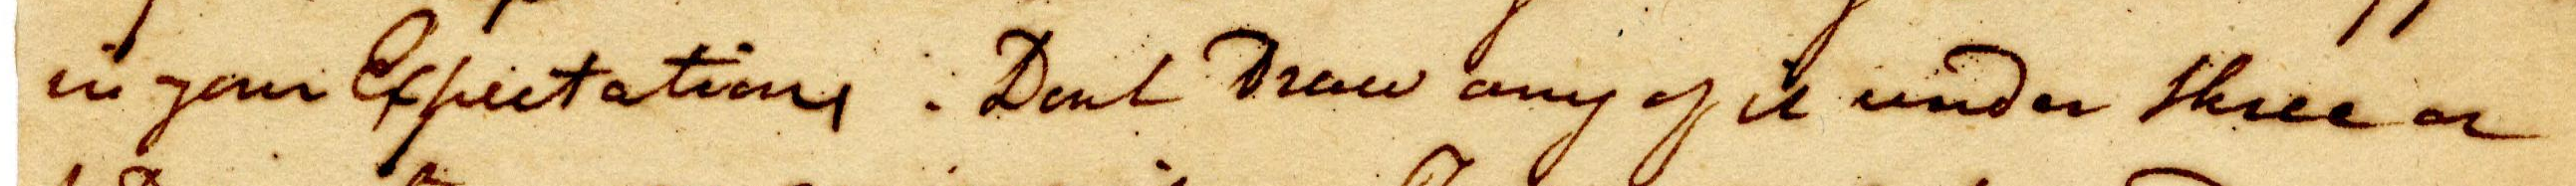in your Expectations. Dont draw any of it under three or
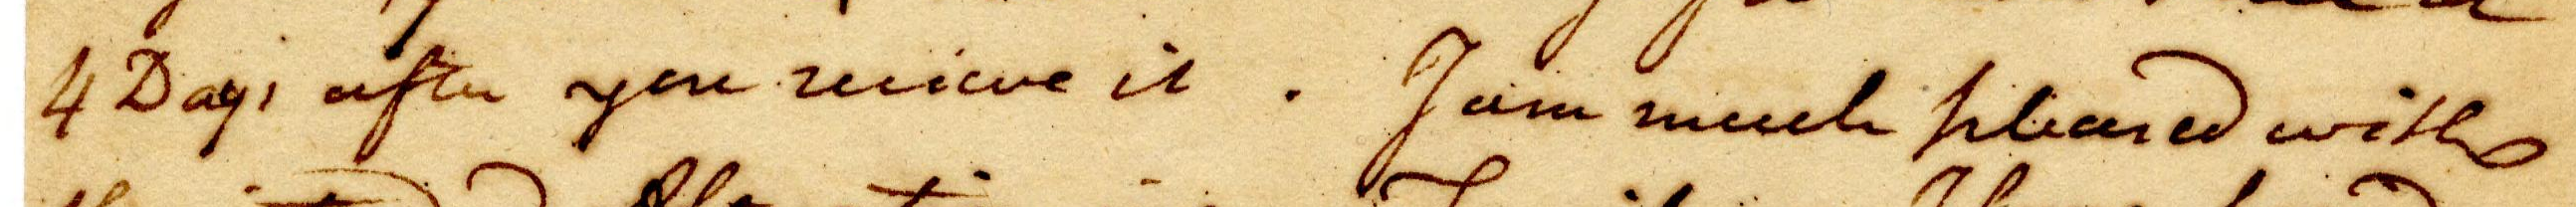4 Days after you receive it. I am much pleased with
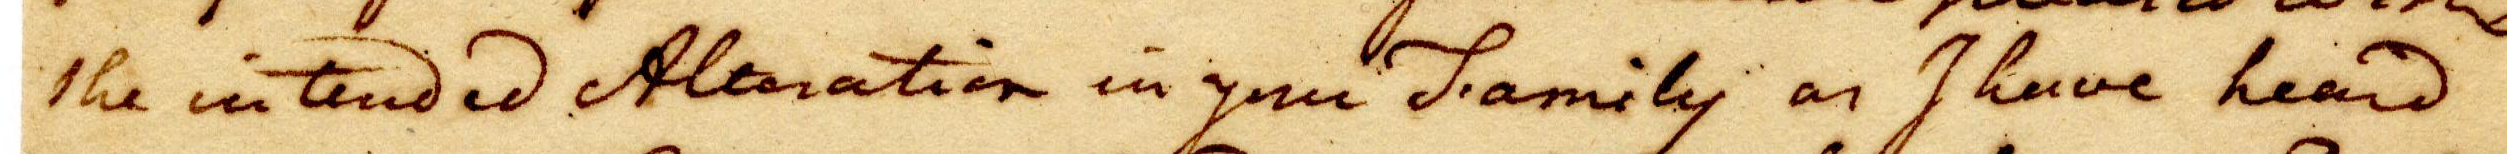the intended Alteration in your Family as I have heard
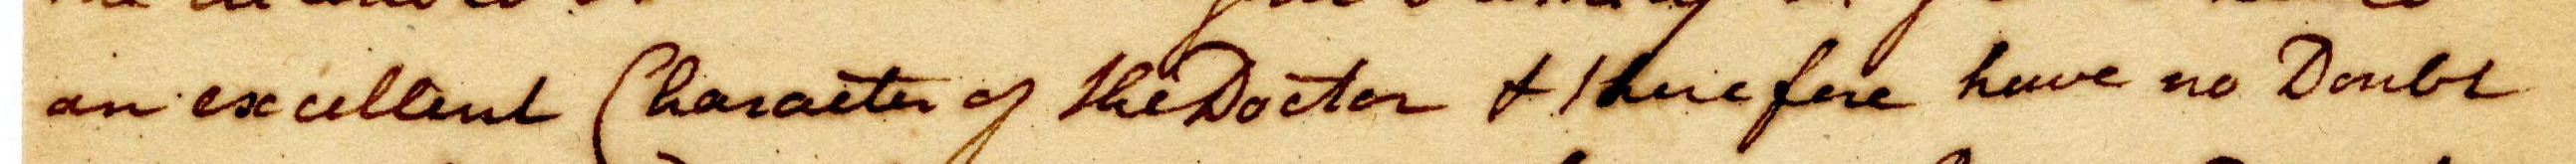an excellent Character of the Doctor & therefore have no Doubt
